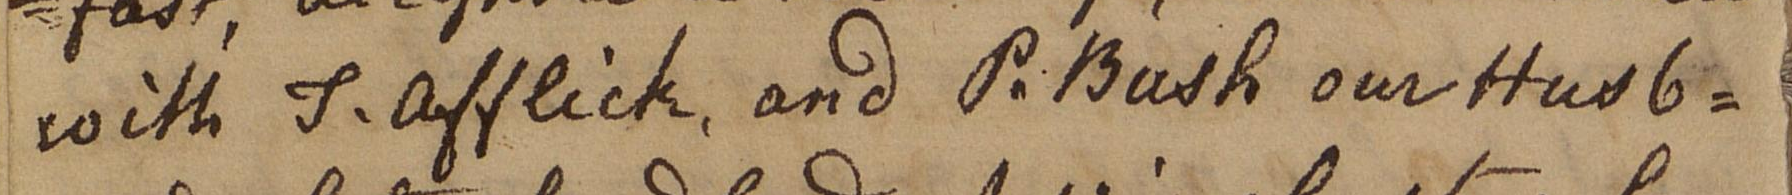with T. Afflick, and P. Bush our Husb-
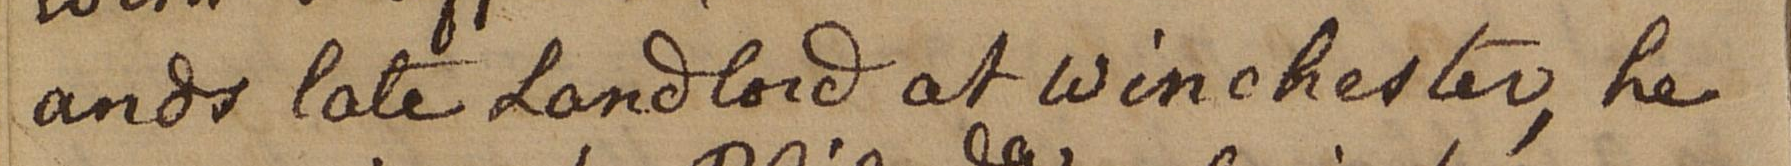ands late Landlord at Winchester, he
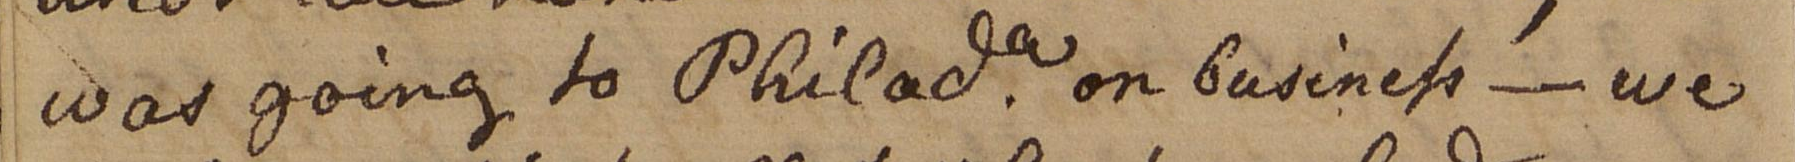was going to Philad^a. on business- we
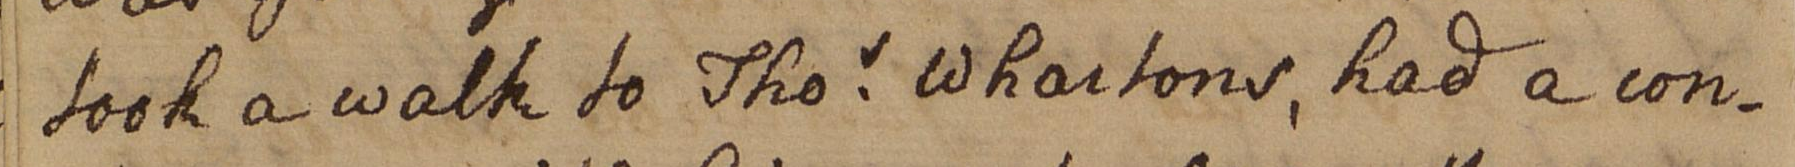took a walk to Tho^s. Whartons, had a con-
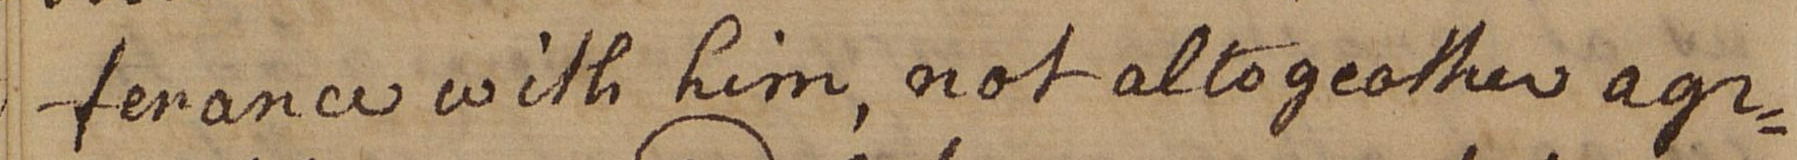-ferance with him, not altogeather agr-
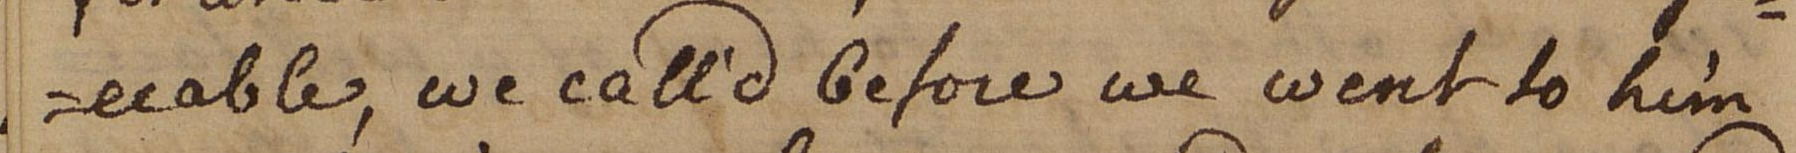-eeable, we call'd before we went to him
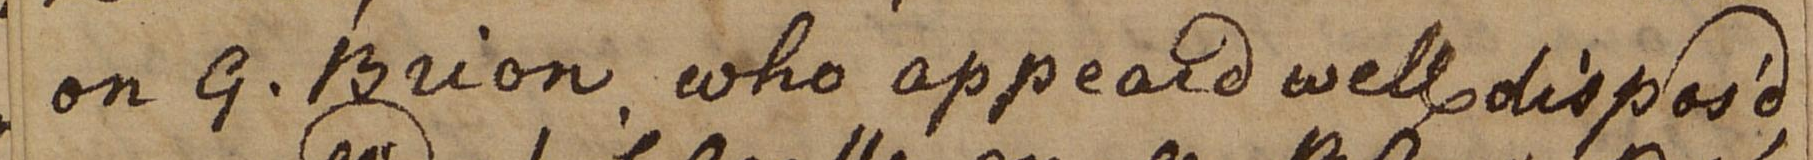on G. Brion, who appeard well dispos'd
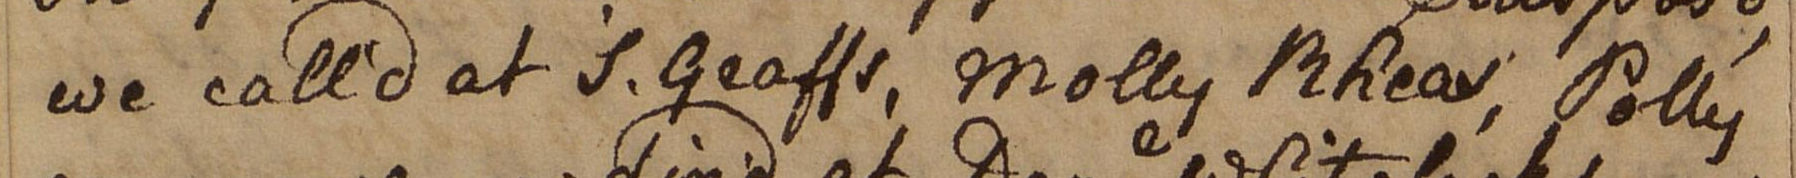we call'd at S. Geaffs, Molly Rheas, Polly
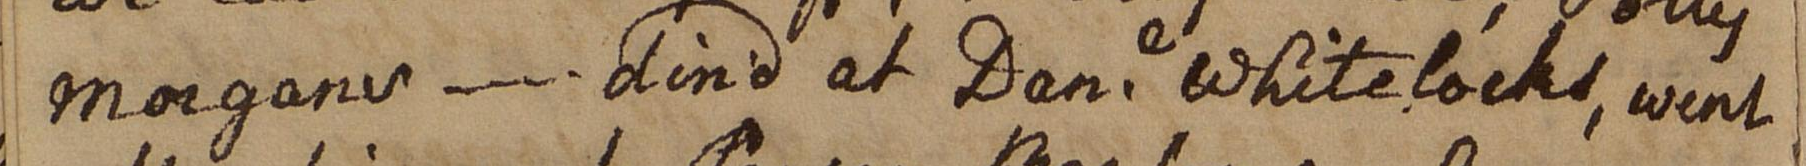Morgans- din'd at Dan^l. Whitelocks, went
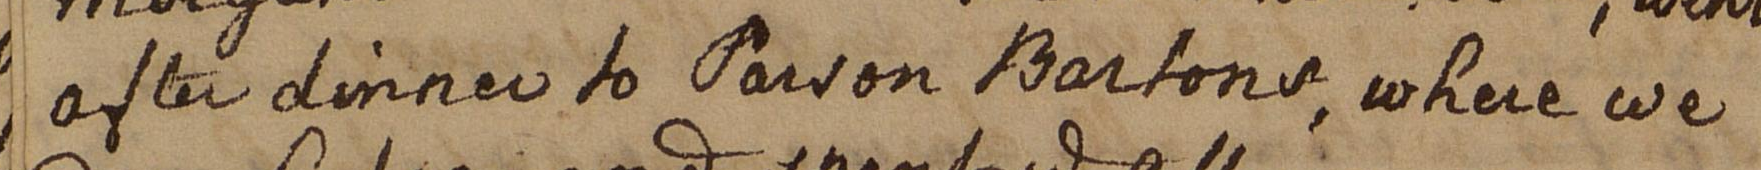after dinner to Parson Bartons, where we
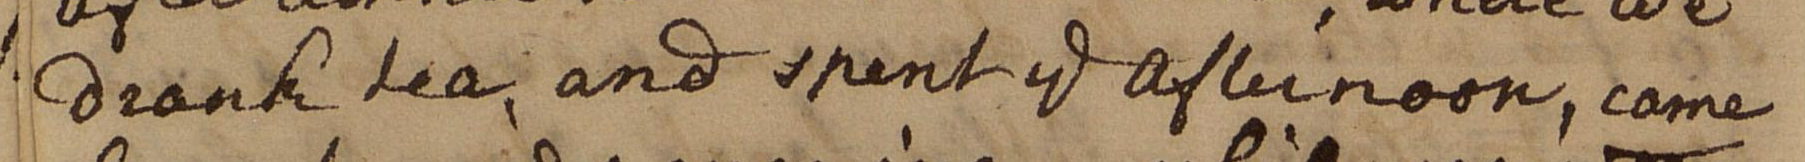drank tea, and spent y^e afternoon, came
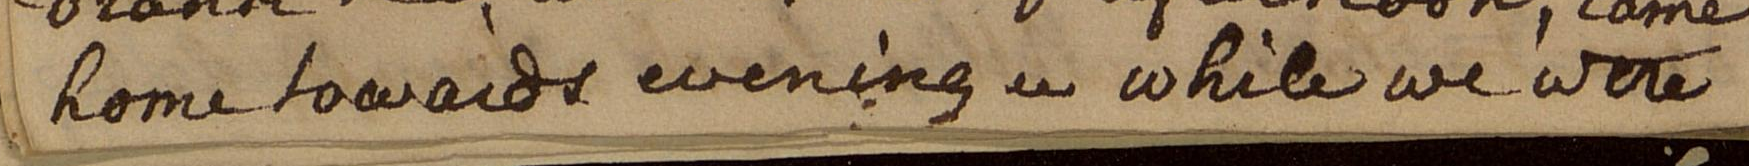home towards evening - while we were
